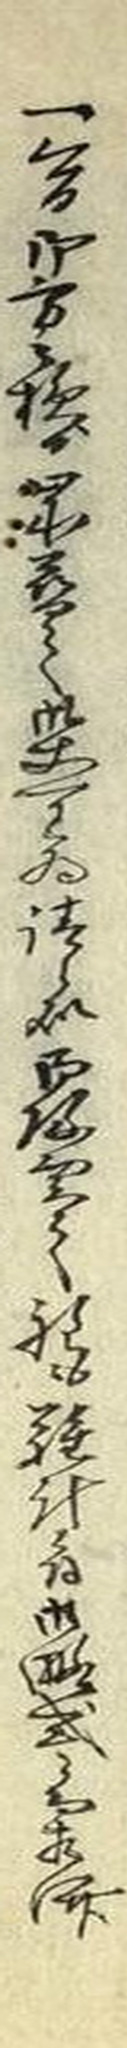一今日御方々様ゟ歳暮之御使可被為請候処御帰殿之程も難計ニ付御略式ニ而相済
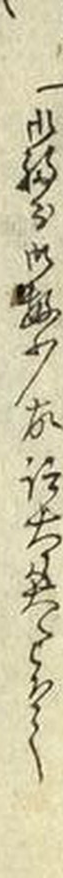御福分御数少故跡大奥へ被下之
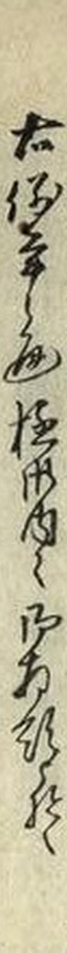右例年之通極御内々御拝領被遊候

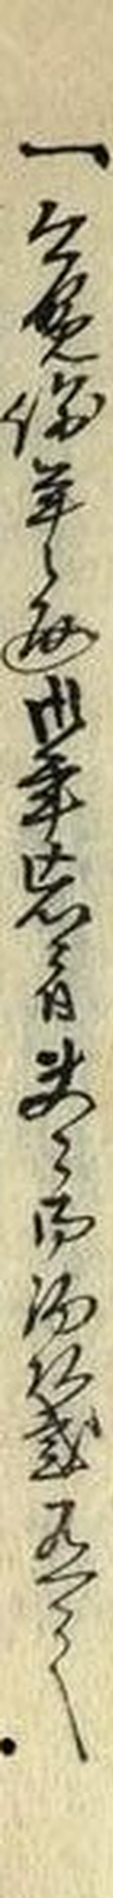一今晩例年之通御年忘ニ付夫々御酒頂戴有之
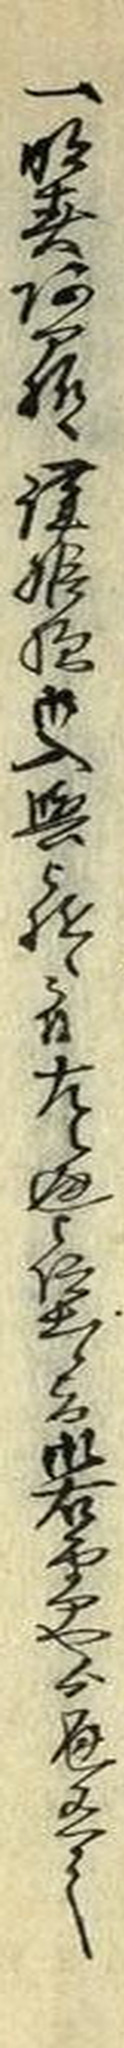一明春阿部様へ謹姫様御入輿被遊候ニ付左之通被仰出候旨御右筆部屋ゟ通有之
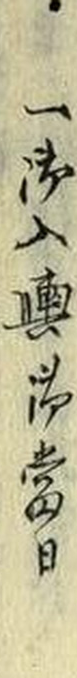一御入輿御当日
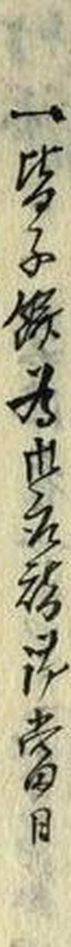一皆子餅為御取替御当日
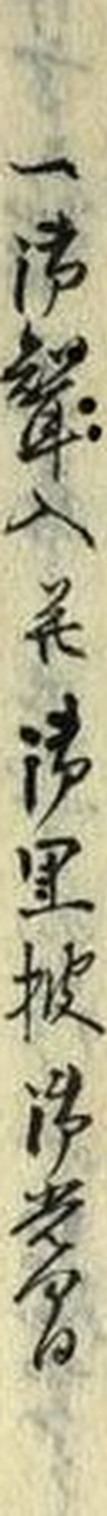一御聟入幷御里披御当日
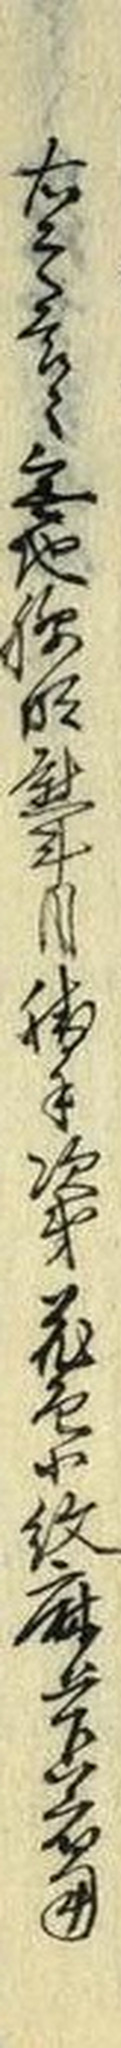右之節々無地腰明熨斗目勝手次第花色小紋麻上下着用
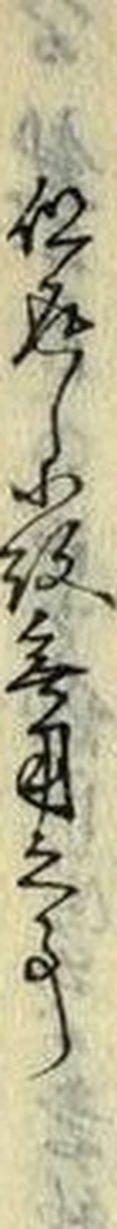但通し小紋無用之事
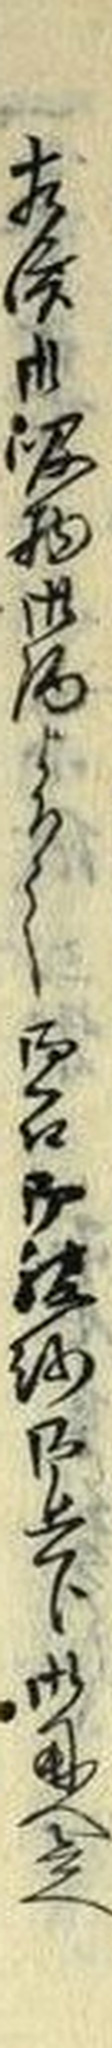相済御吸物御酒被下之御召御服紗御上下御用人壱人花木馨助
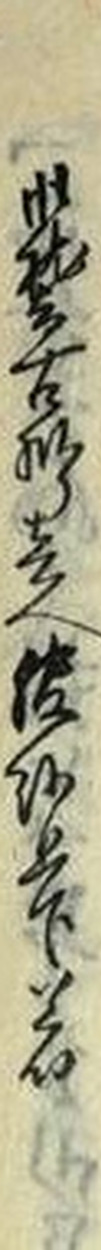御稽古掛り壱人服紗上下着
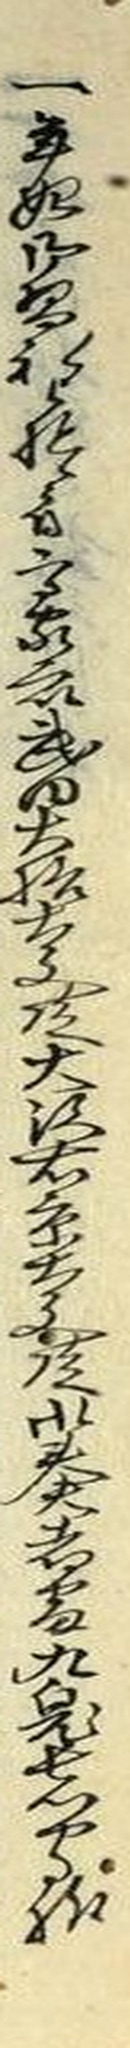一年始御習礼被遊候ニ付高家衆武田大膳大夫殿大沢右京大夫殿御奏者番九鬼長門守様
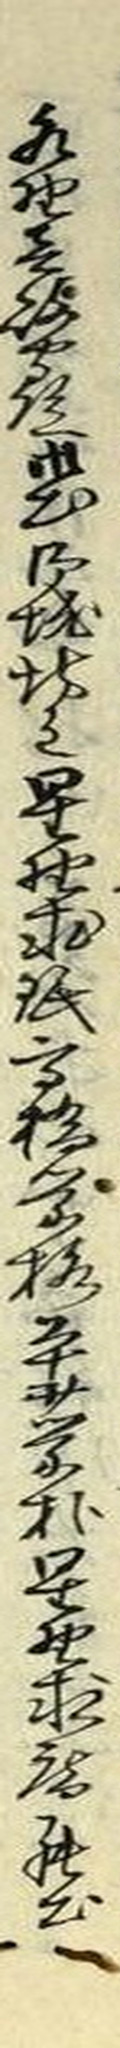水野壱岐守殿御出御城坊主星野求珉高橋栄格平井栄朴星野求庵罷出
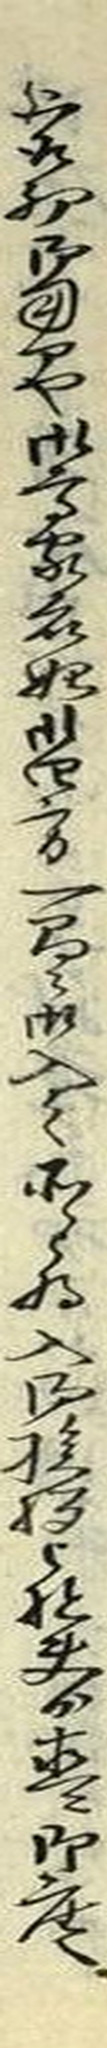最初御用部屋御高家衆始御四方一間ニ御入之所へ被為入御挨拶被遊夫ゟ直ニ御座之
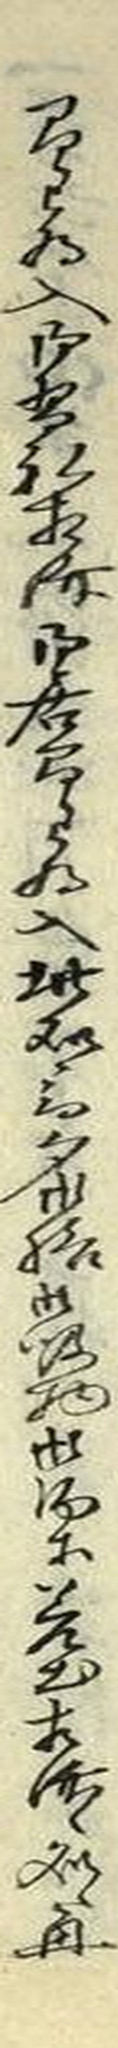間へ被為入御習礼相済御居間へ被為入此処ニ而夕御膳御吸物御酒等差出相済候処へ再
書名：少傅日録抄（斉善付側向頭取日記、在府）
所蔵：福井県文書館 Fukui Prefectural Archives
